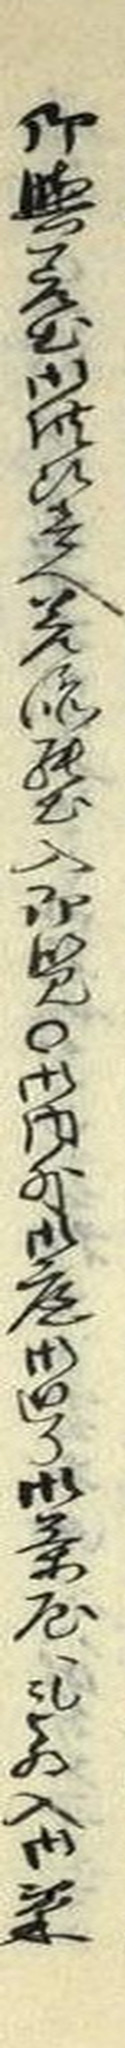御輿差出御供頭壱人差添罷出入御覧〇御内外御庭御廻り御茶屋へも被為入御菓
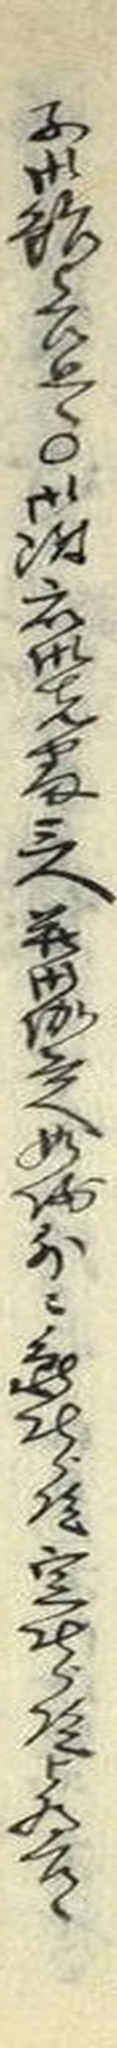子御鮓被召上候〇御附衆御先番三人幷御伽壱人如例外ニ亀次郎殿定次郎殿被為召候
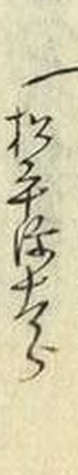松平源太郎
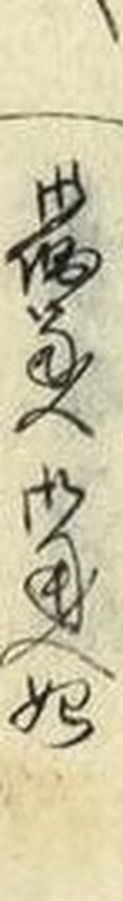御側御用人御用人始
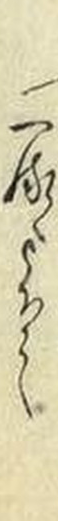一縁へ被下之

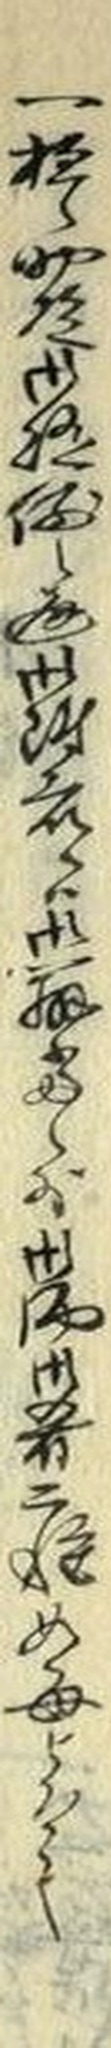一桓之助殿御賄例之通御附衆ヘハ御弁当之外御酒御肴二種如毎被下之
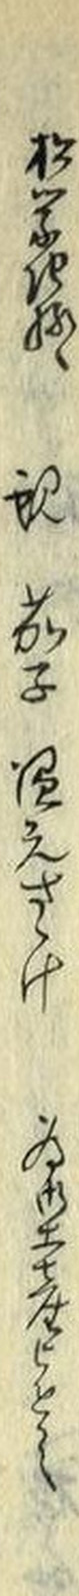松栄院様へ蜆茄子隠元さヽけ為御土産被進之
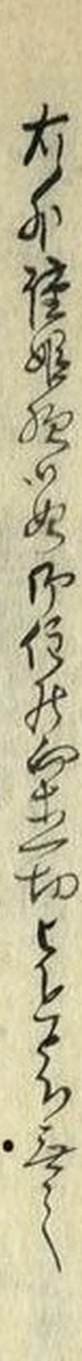右ノ外謹姫様御始御住居向等一切被進被下無之
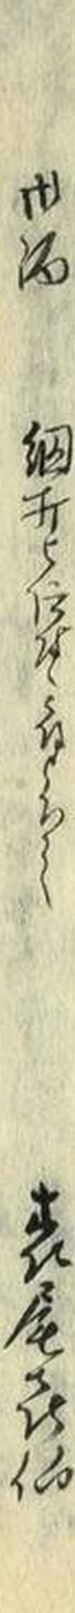御酒網打被仰付候ニ付被下之森尾喜伯
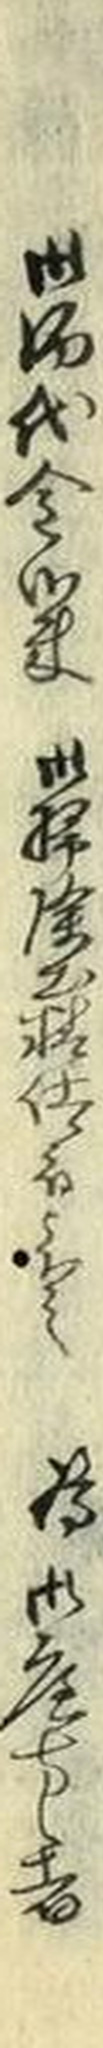御酒代金弐朱御掃除出精仕候ニ付被下之嶋御庭方之者
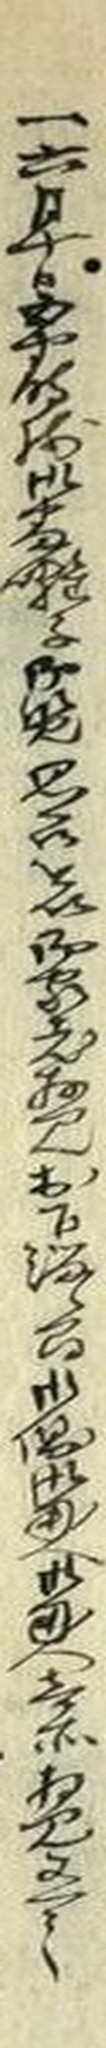一六月十日五半時揃御番囃子御覧思召を以御家老拝見於下溜之間御側御用人御用人壱所拝見有之
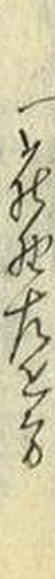荻野左近方
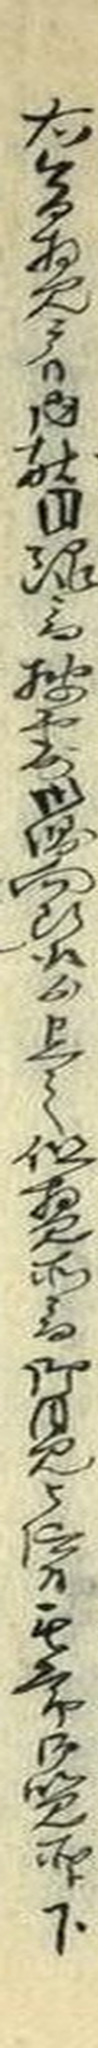右今日拝見ニ付内献目録ニ而披露御側向頭取ゟ申上之但拝見所ニ而御目見被仰付其節御覧所ト下
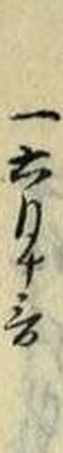一六月十三日
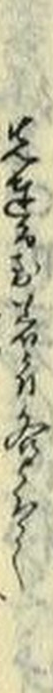先達而到着ニ付各被下之
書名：少傅日録抄（斉善付側向頭取日記、在府）
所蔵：福井県文書館 Fukui Prefectural Archives
